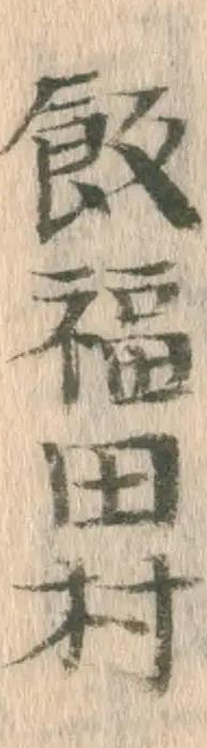飯福田村
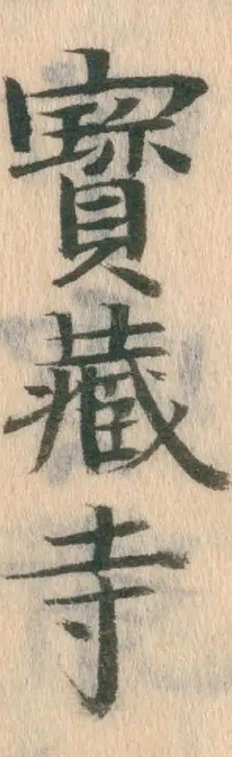宝蔵寺
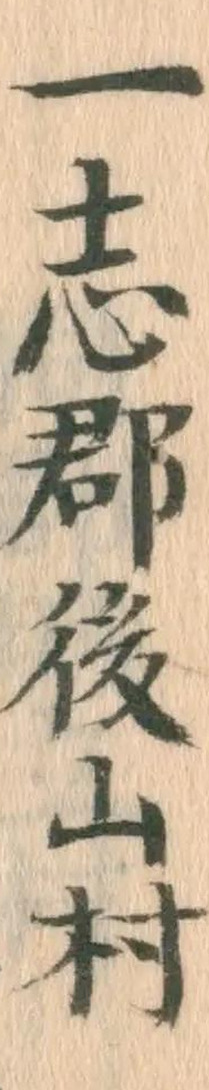一志郡後山村
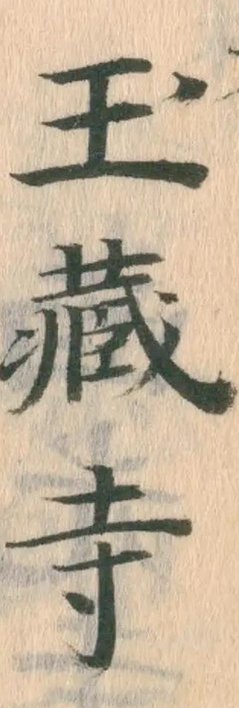宝蔵寺

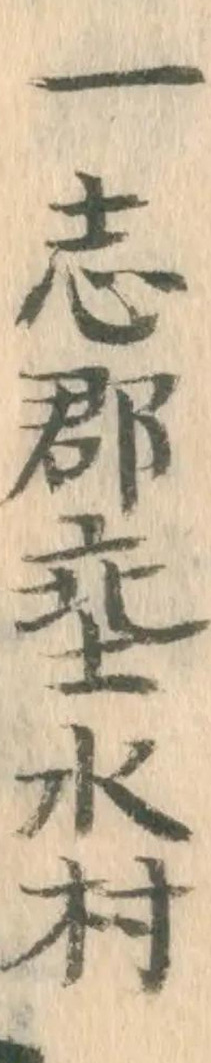一志郡埀水村
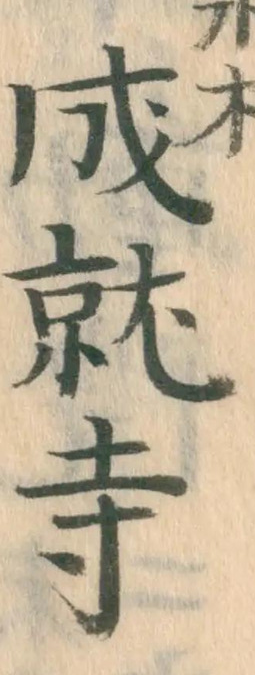成就時
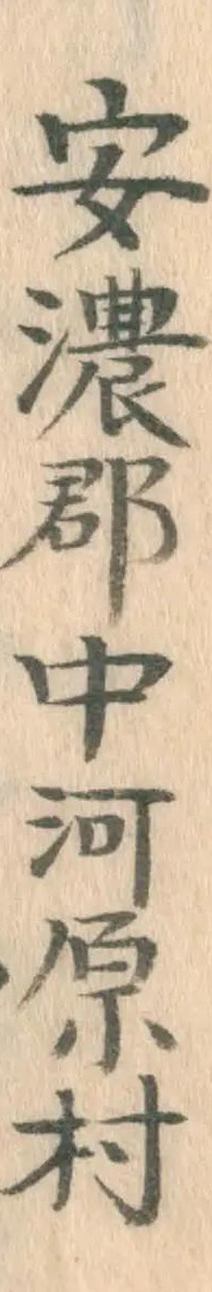安濃郡中河原村
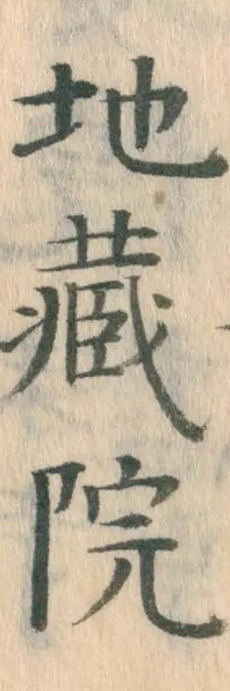地蔵院
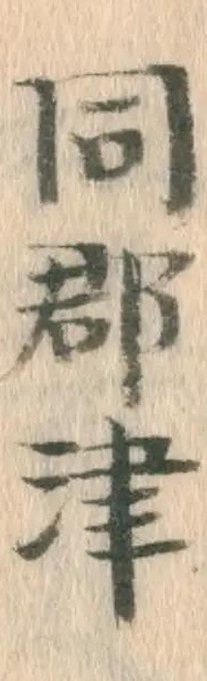同郡津
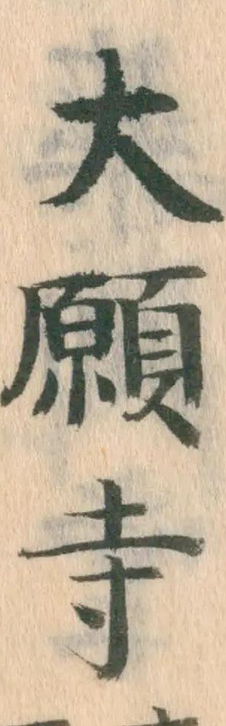大円寺
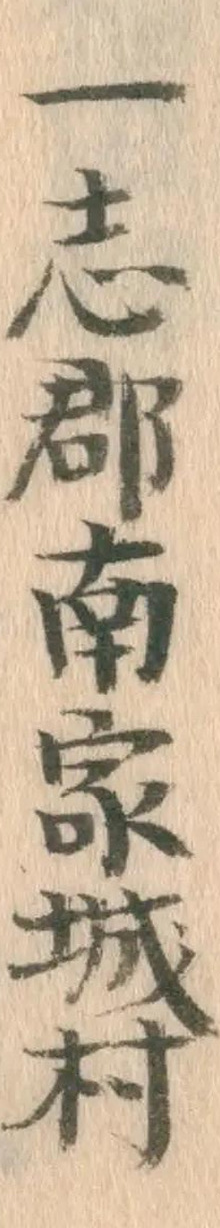一志郡南家城村
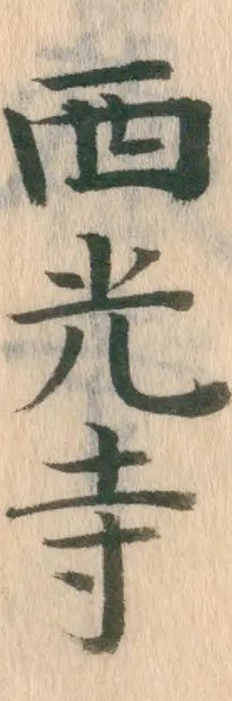西光寺
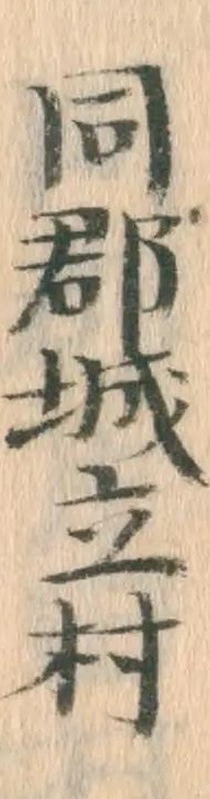同郡城立村
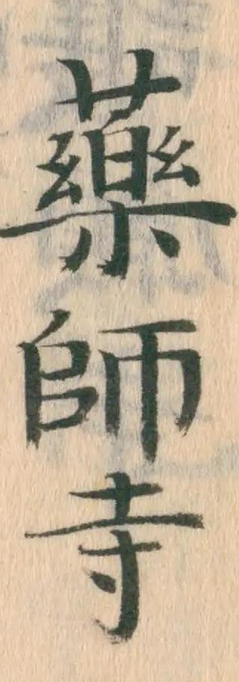薬師寺
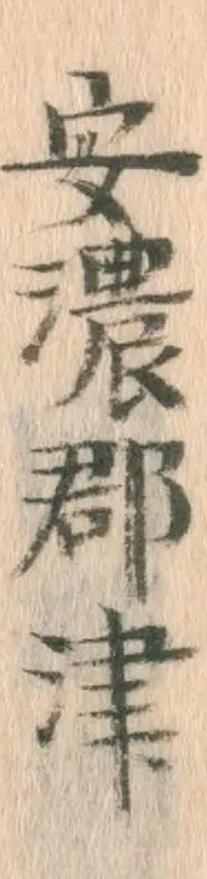安濃郡津
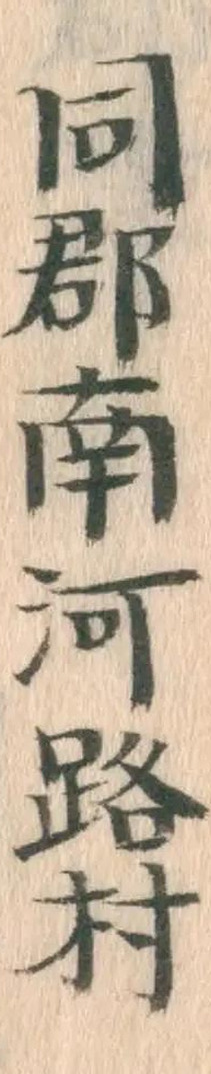同郡南河路村
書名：古義真言宗本末帳 21巻. [4] 第三 伊賀国、伊勢国、志摩国、尾張国、三河国、遠江国、駿河国、伊豆国、甲斐国
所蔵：国立国会図書館 National Diet Library, JAPAN
